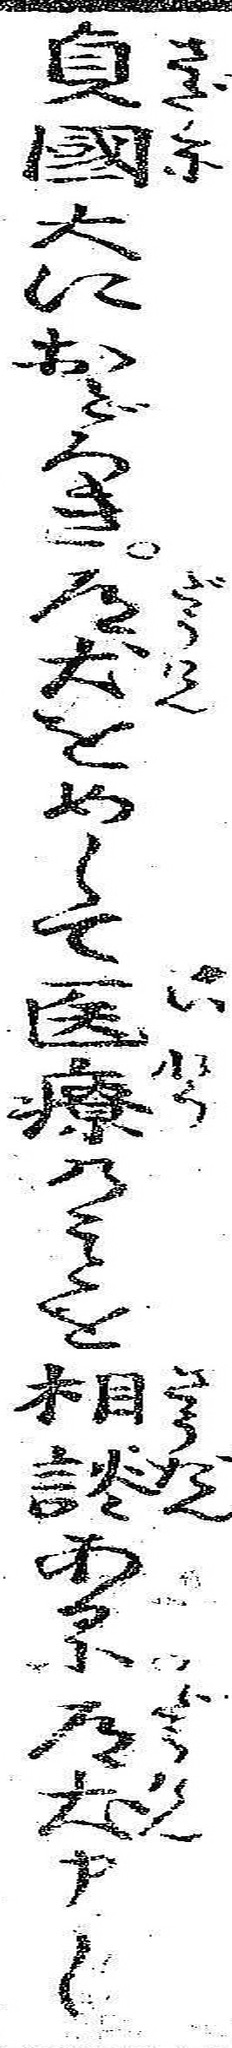貞国大におどろき。道犬をめして医療のことを相談あるに。道犬申し
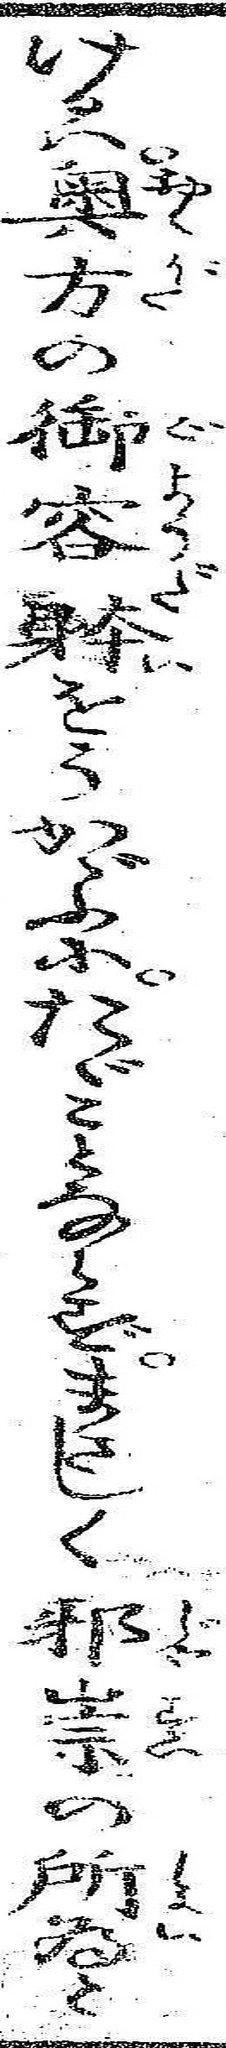けるは。。奥方の御容体をうかゞふに。たゞことならず。まさしく邪崇の所為と
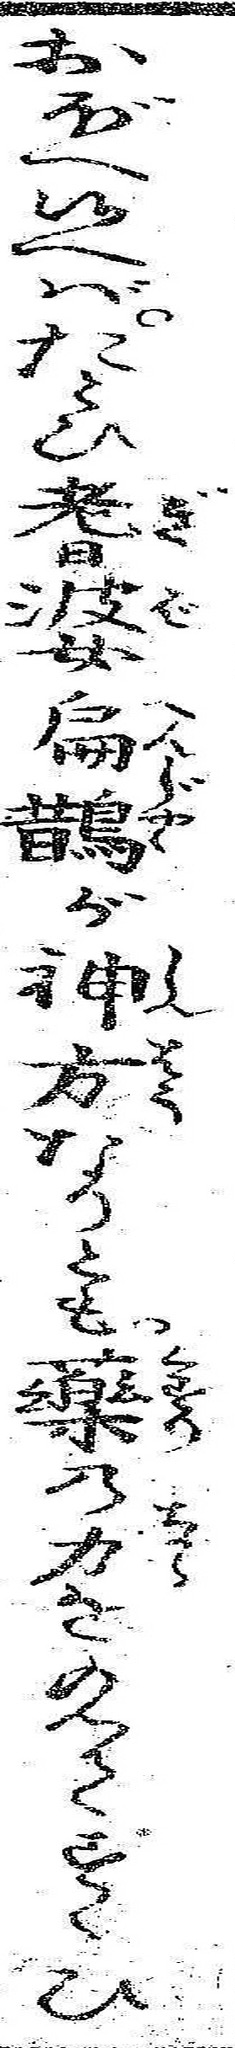おぼへ候へば。たとひ耆婆扁鵲が神方なりとも。薬の力をもつてすくひ
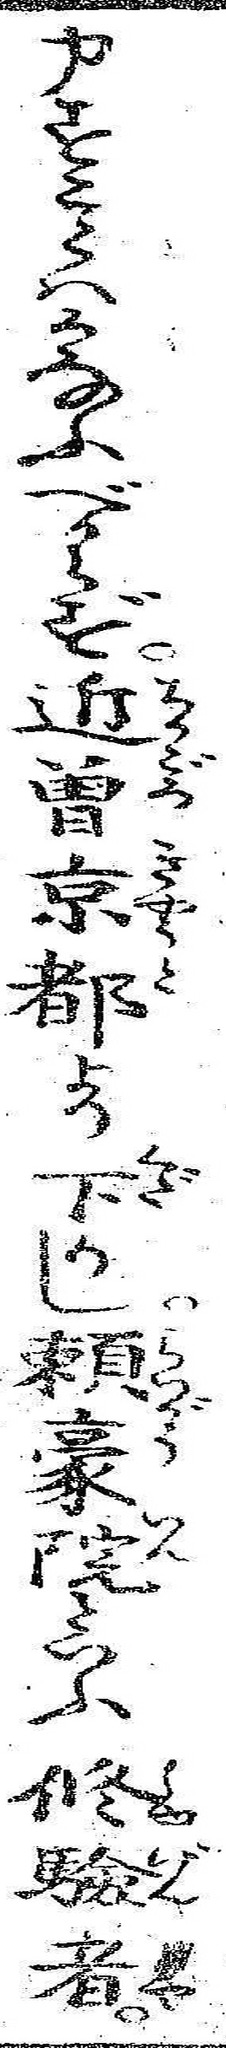申すことはかなふべからず。近曽京都より下りし。頼豪院といふ修験者。

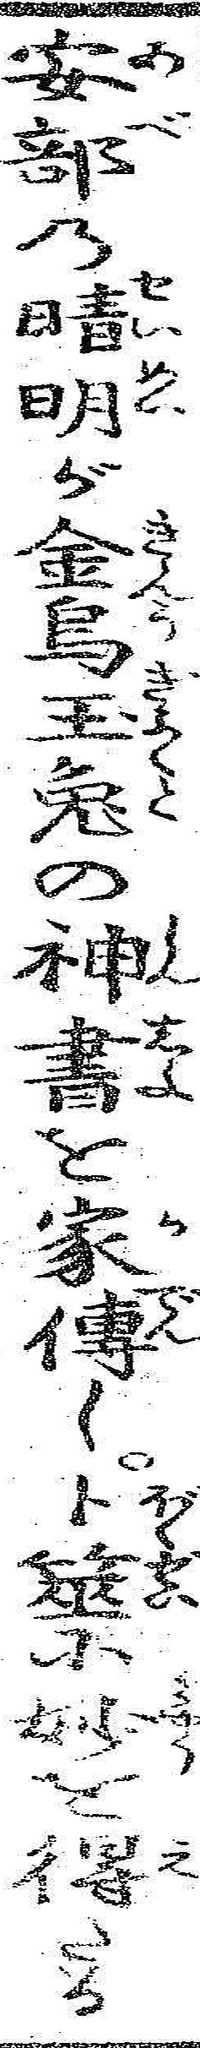安部の晴明が金烏玉兎の神書を家伝し。卜筮に妙を得たる
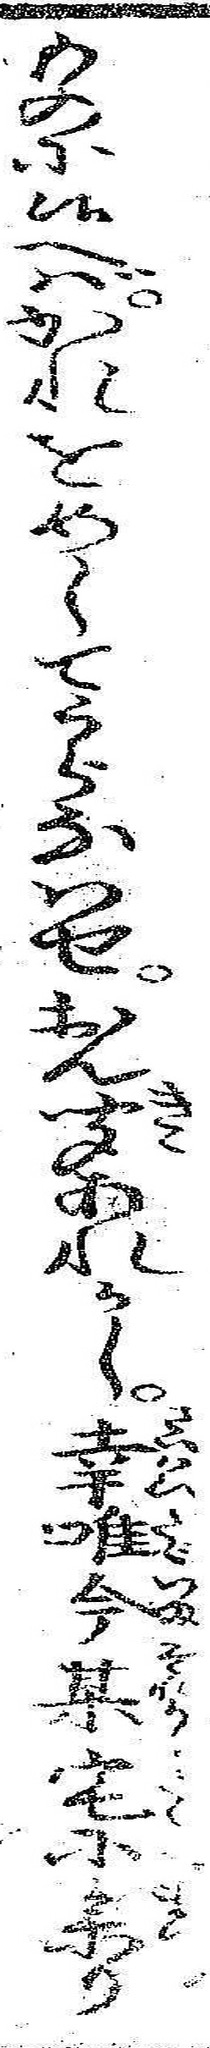ものに候へば。かれをめしてうらなはせ。おん聞あれかし。幸唯今某宅に参り
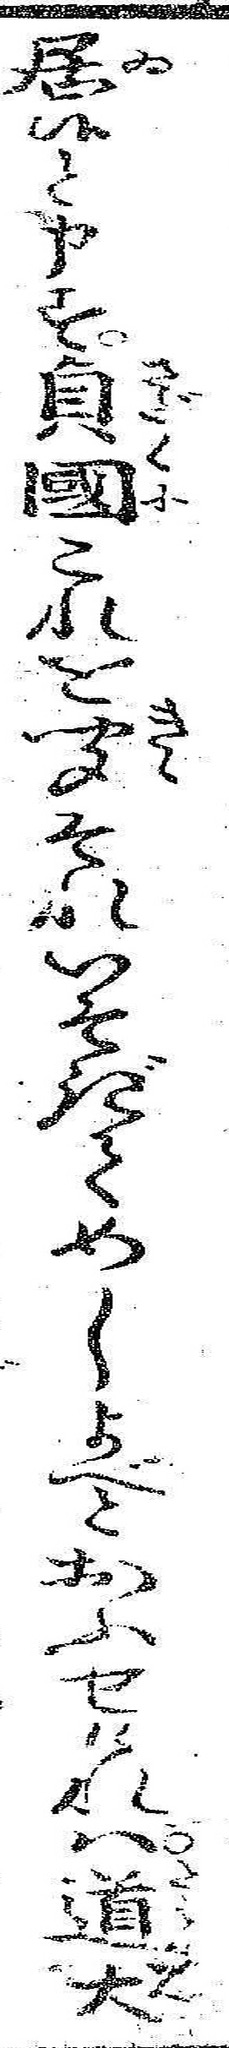居候と申す。貞国これを聞それいそぎてめしよべとおふせけれは。道犬
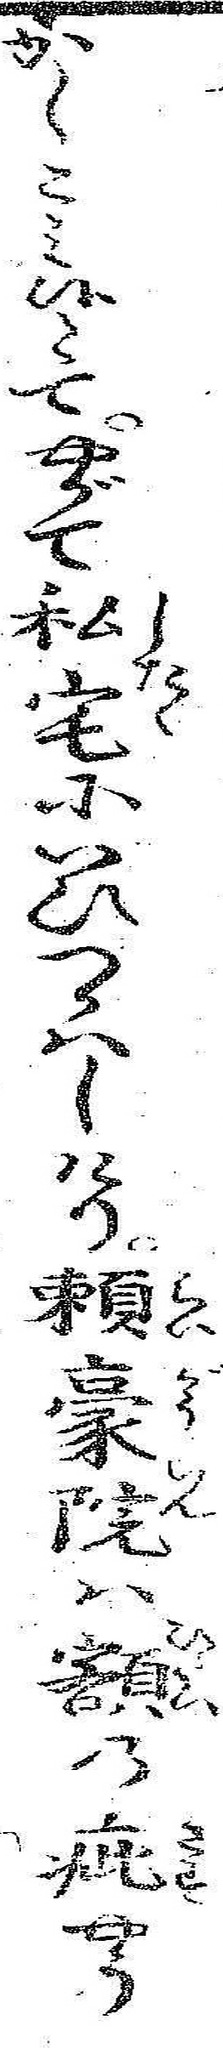かしこみ候とて。やがて私宅にいひつかはしけり。頼豪院は額の疵やう
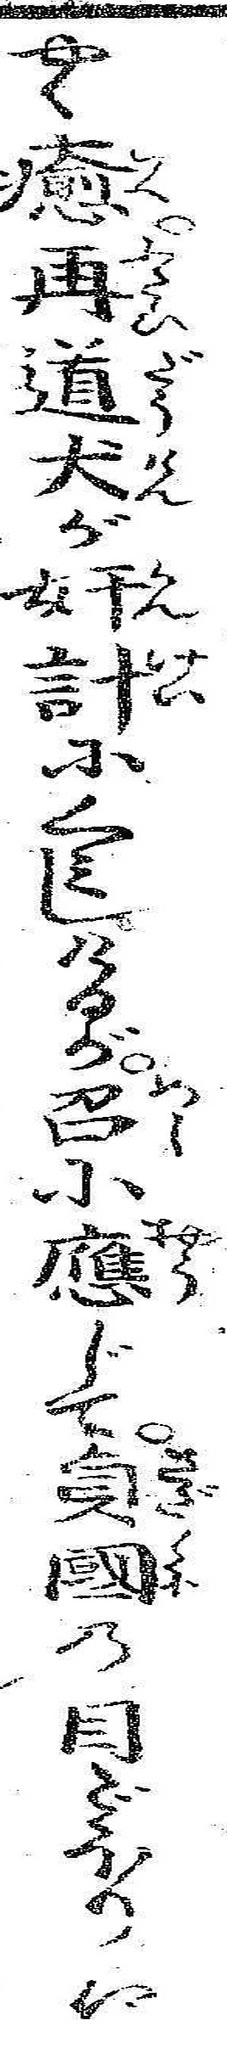やく癒。再道犬が奸計にくみしけるが。召に応じて。貞国の目どほりに
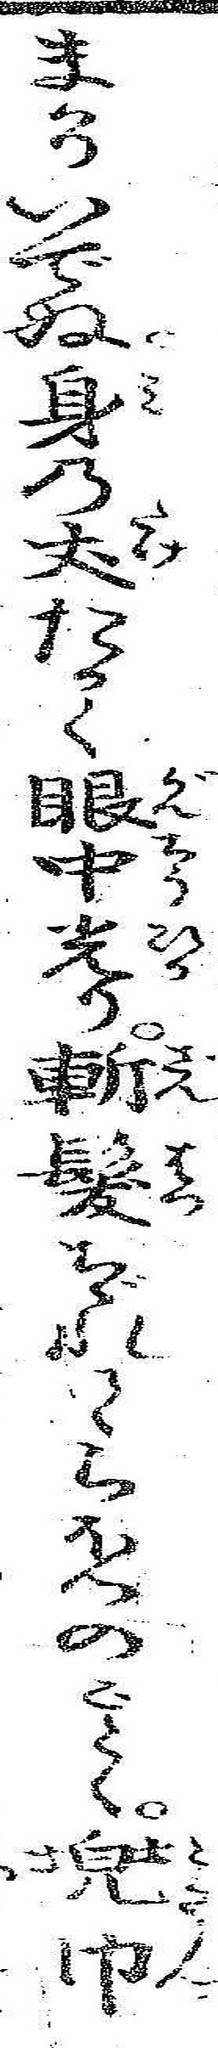まかりいでぬ。身の丈たかく眼中光り。斬髪ちゞれてらほつのごとく。兜巾
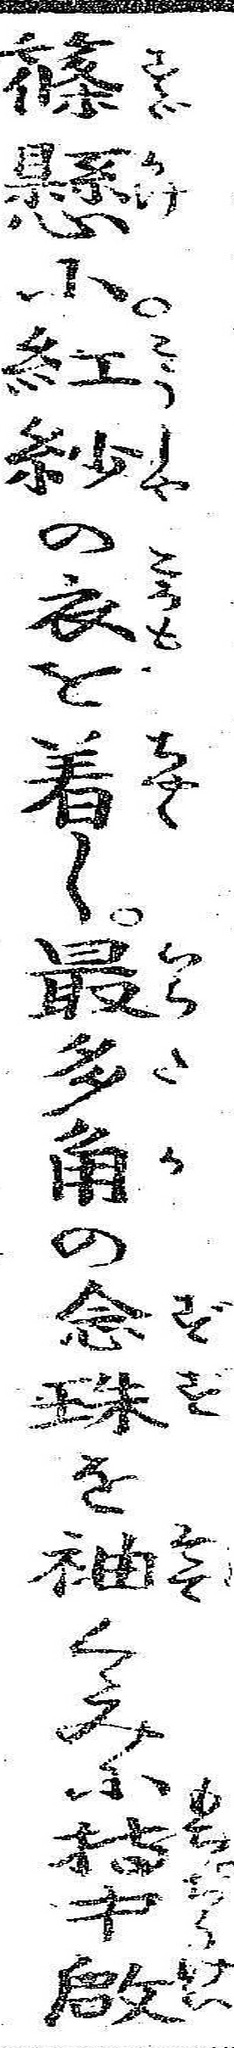篠懸に。紅紗の衣を着し。最多角の念珠を袖くゝみに持。中啓
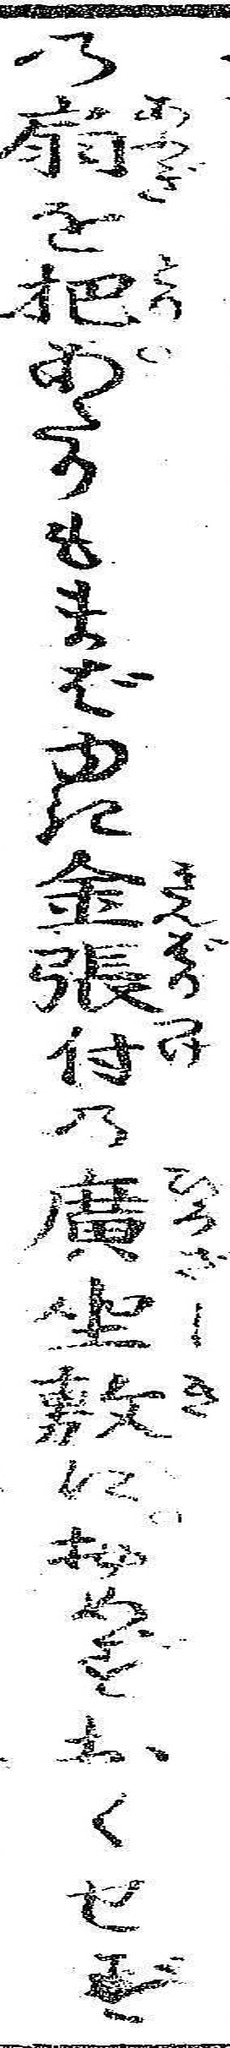の扇を把。あたりもまばゆき金張付の広坐敷に。おめずおくせず
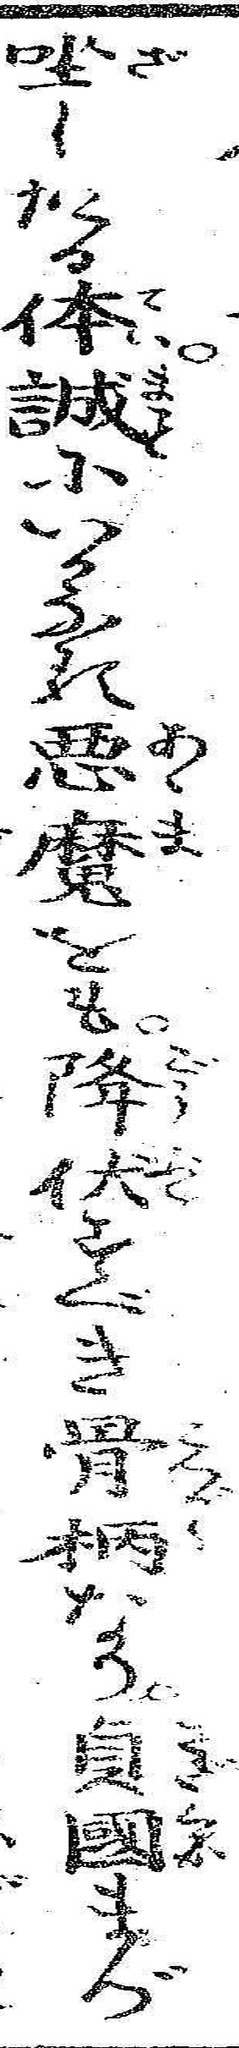坐したる体。誠にいかなる悪魔をも。降伏すべき骨柄なり。貞国まづ
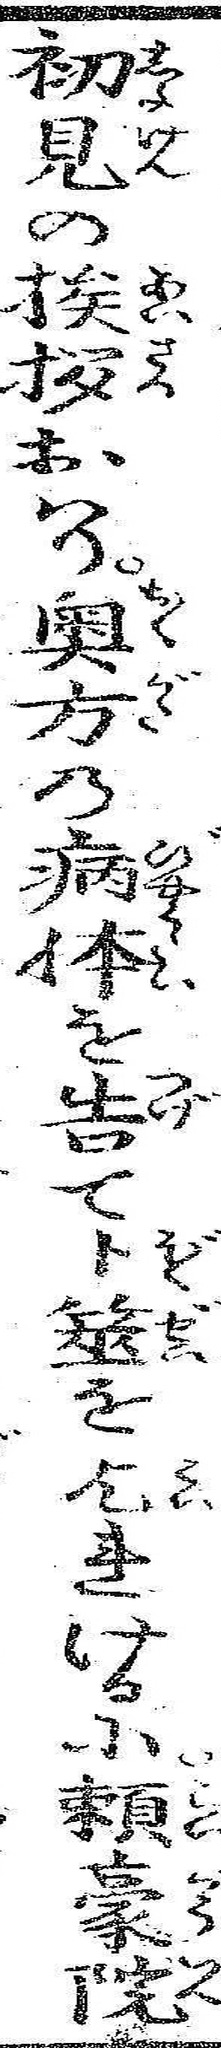初見の挨拶おはり。奥方の病体を告て卜筮を乞れけるに。頼豪院
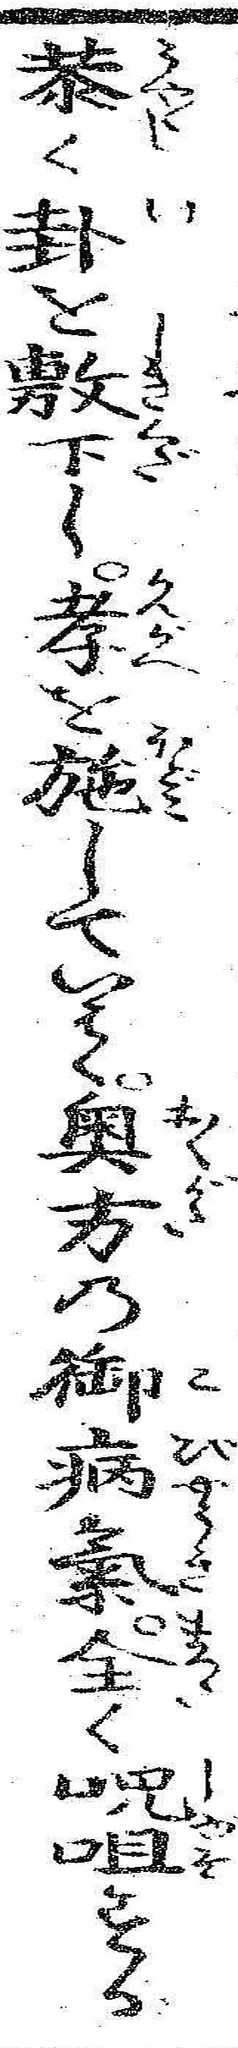恭く卦を敷下し。孝を施していはく。奥方の御病気。全く呪咀する
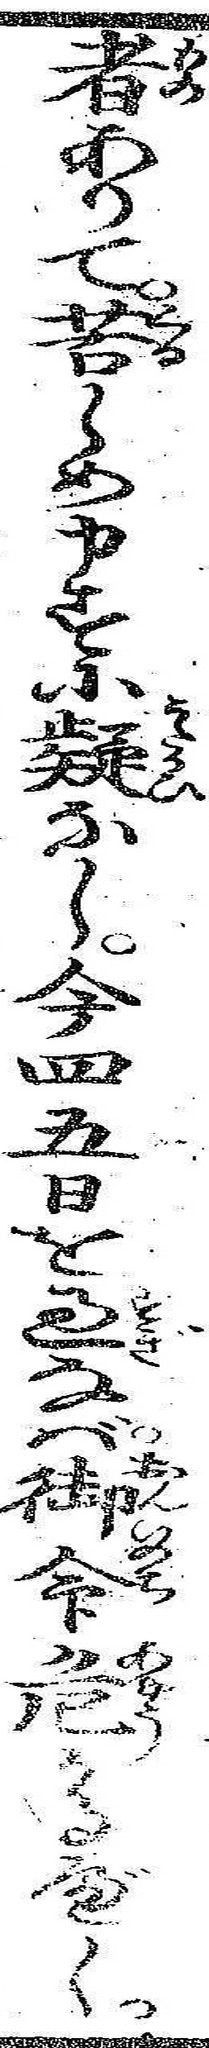者ありて。苦しめ申すに疑なし。今四五日を過なば。御命危かるべし。
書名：昔話稲妻表紙
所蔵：国文学研究資料館
